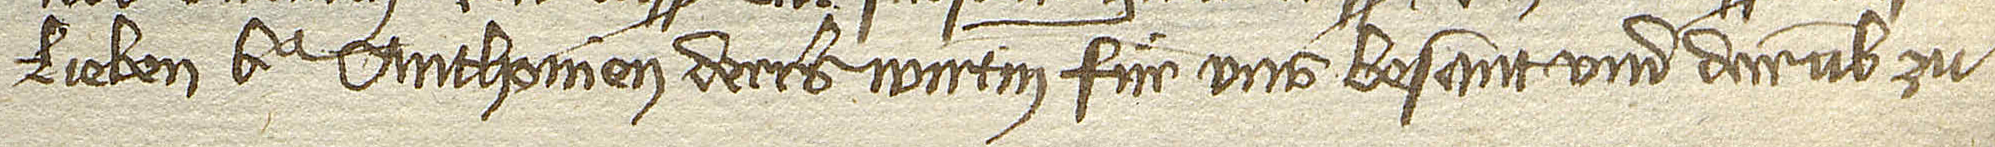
lieben b* Anthonien derr*s wirtin für vns beſant vnd darub* ʒu
